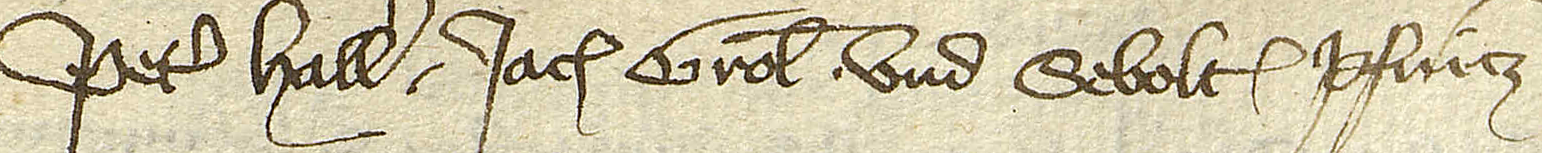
Pet* Hall* / Iac* Grol* . vnd Sebolt* Pfincʒ*
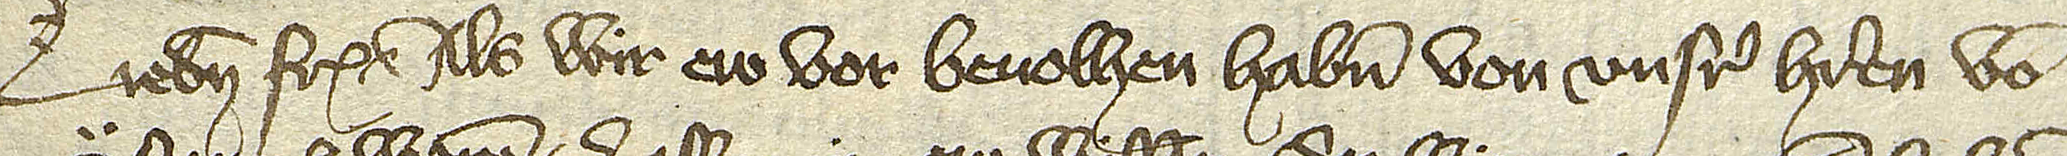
Liebn* fr* / Als wir ew vor beuolhen habn* von vnſr* hr*en vo*
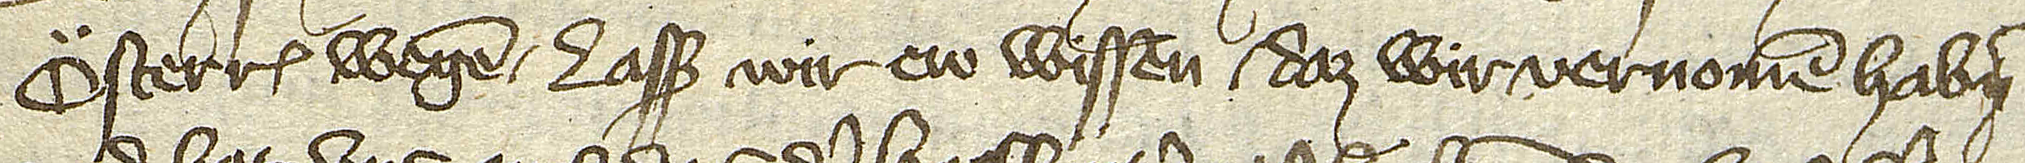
Öſterr* wege* / Laſſ* wir ew wiſſen / daʒ wir vernome* habn*
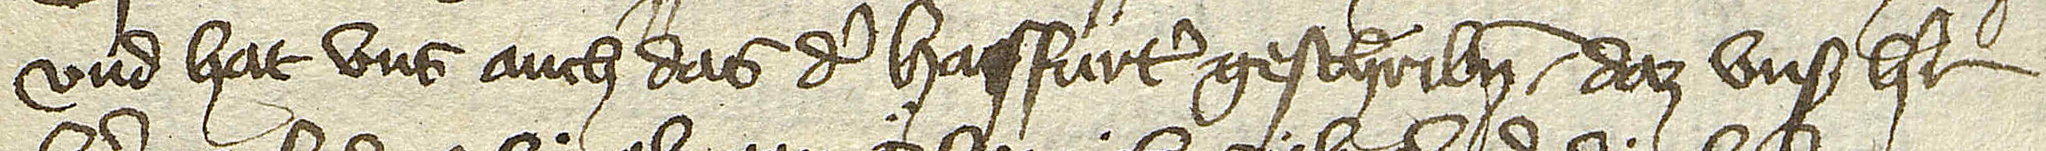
vnd hat vns auch das d* Haſfürt* geſchribn* / daʒ vnſ* hr*
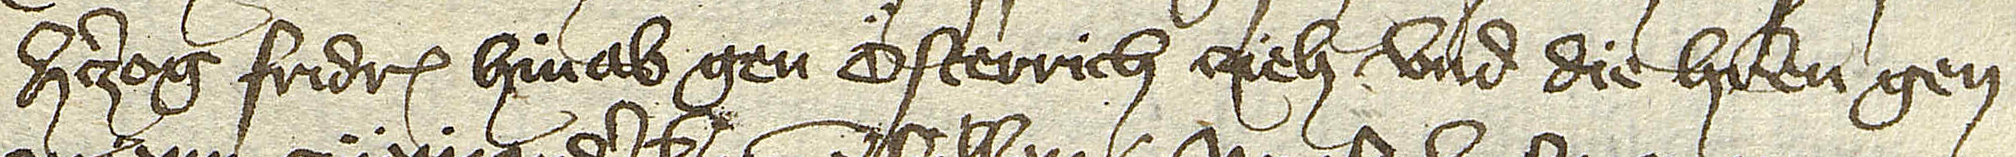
H*cʒog fridr* hinab gen Öſterrich cʒieh / vnd die hr*en gen
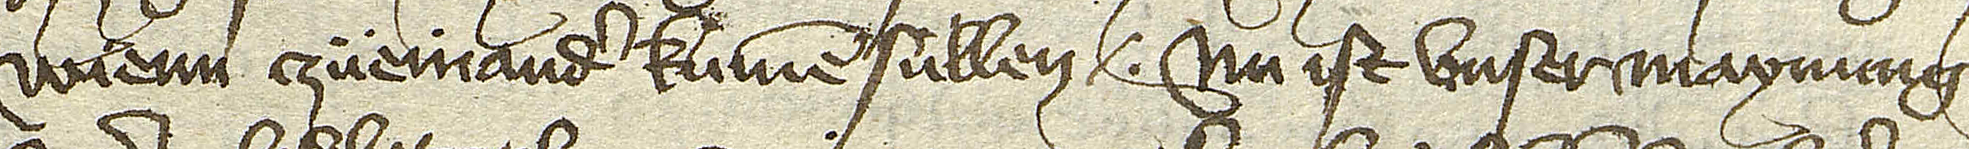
wienn cʒüeinand* kume* ſüllen / . Nu iſt vnſer maynung
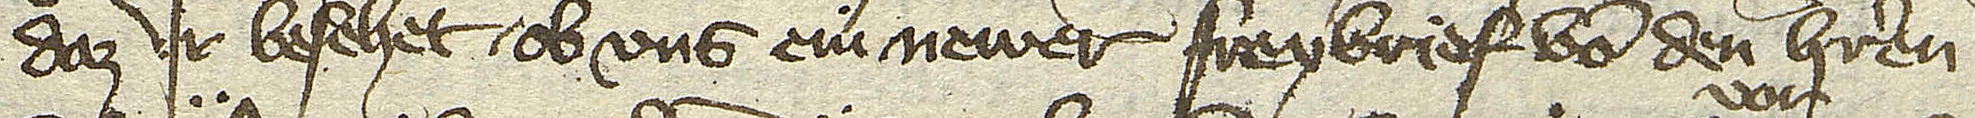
daʒ Ir beſehet / ob vns ein newer freybrief vo* den hr*en
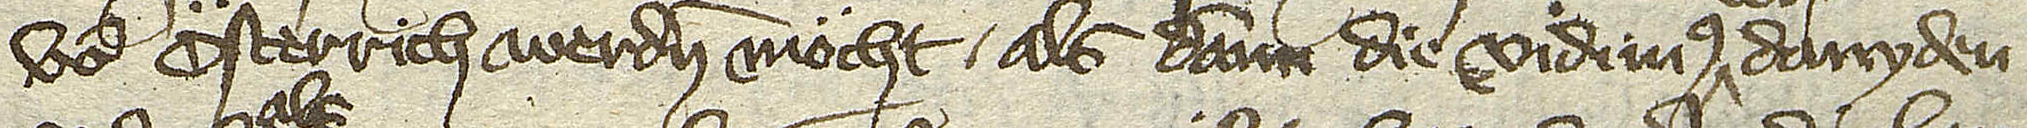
vo* Öſterrich werdn* möcht / als dann* die vidim* danyden
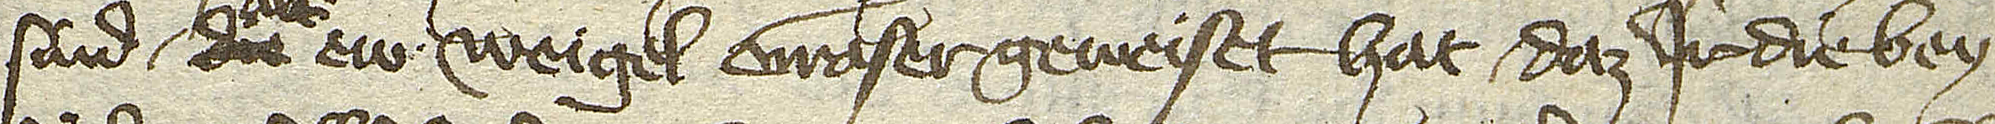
ſind / die ew weigel Graſer geweiſet hat / daʒ Ir die bey
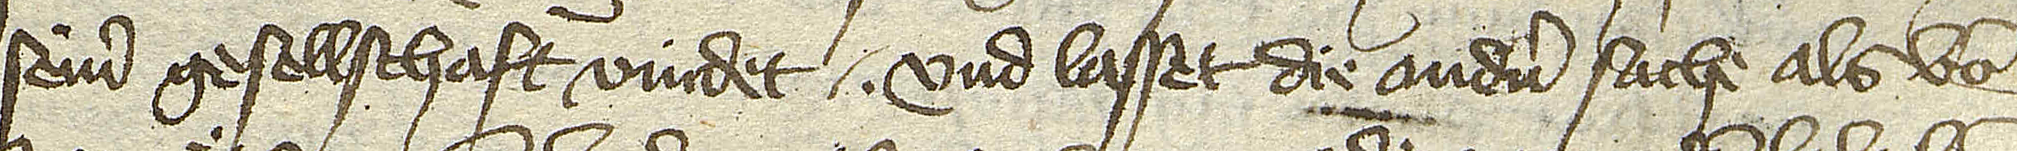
ſein* geſellſchaft vindet / . vnd laſſet die andn* ſache als vo*
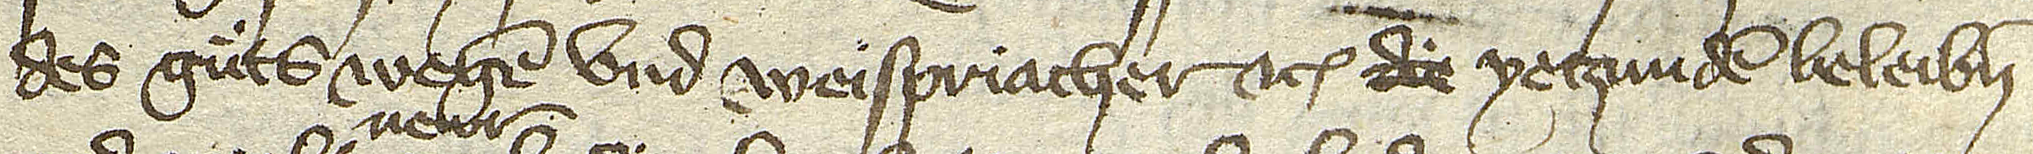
des güts wege* vnd weiſpriacher ec* die yecʒunde* beleibn*
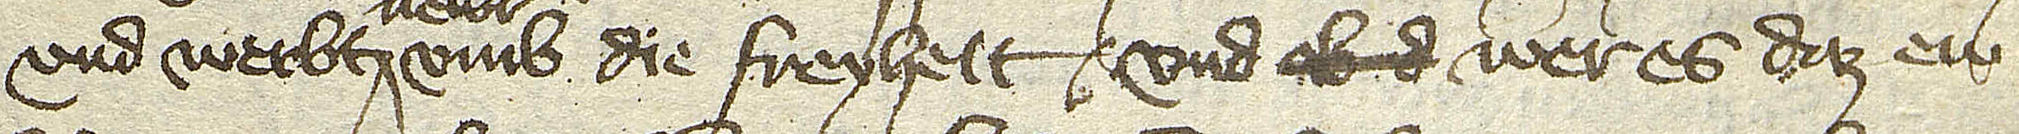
vnd werbt vmb die freyheit / vnd ob d wer es daʒ ew
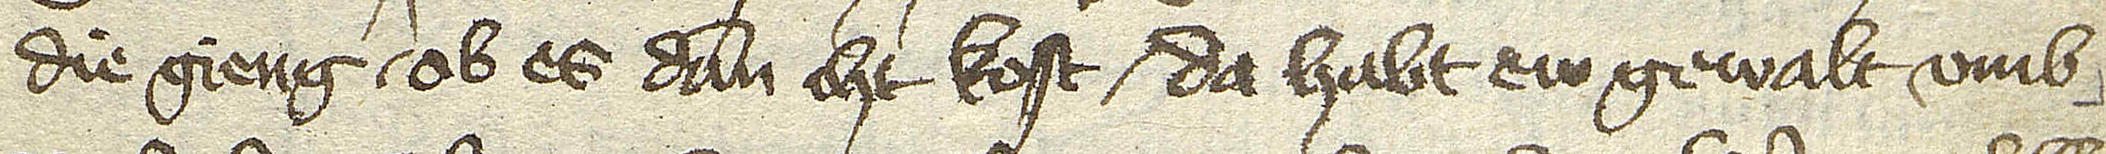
die gieng / ob es dan* iht koſt / da habt ew gewalt vmb
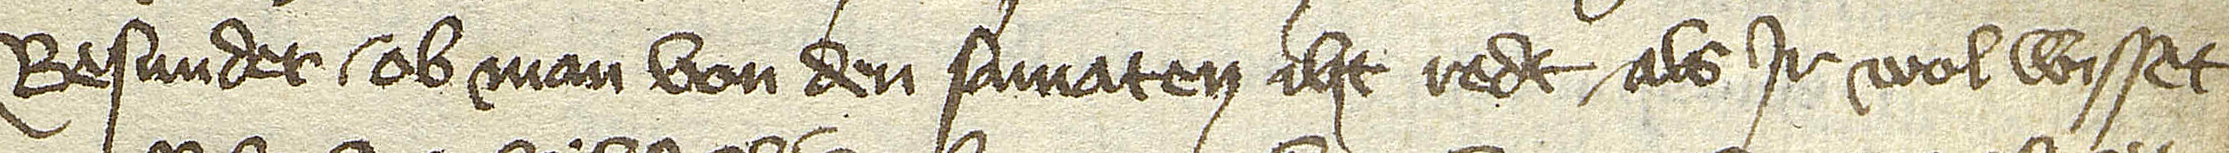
Beſunder / ob man von den ſamaten iht redt / als Ir wol wiſſet
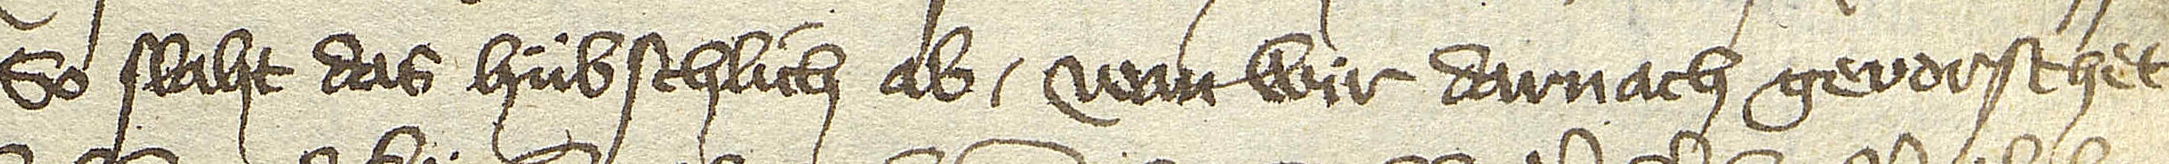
So ſlaht das hübſchlich ab / wan wir darnach gevorſchet
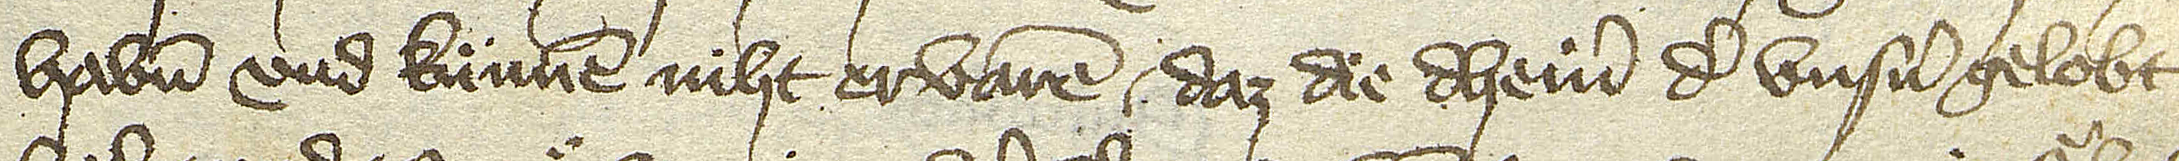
habn* vnd künne* niht ervare* / daʒ die dhein* d* vnſn* gelobt
